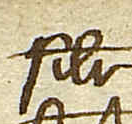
ſilr*
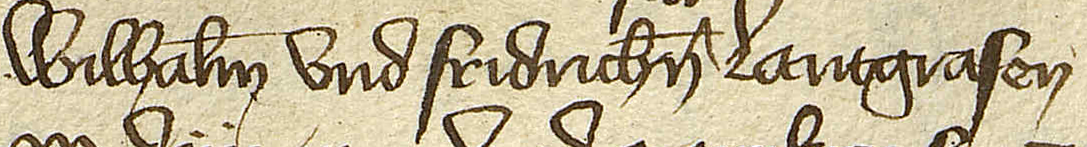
Wilhalm* vnd fridrichn* Lantgrafen
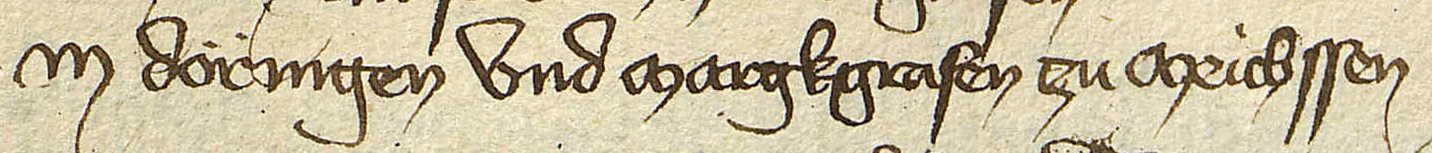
in döringen vnd Margkgrafen cʒu Meichſſen
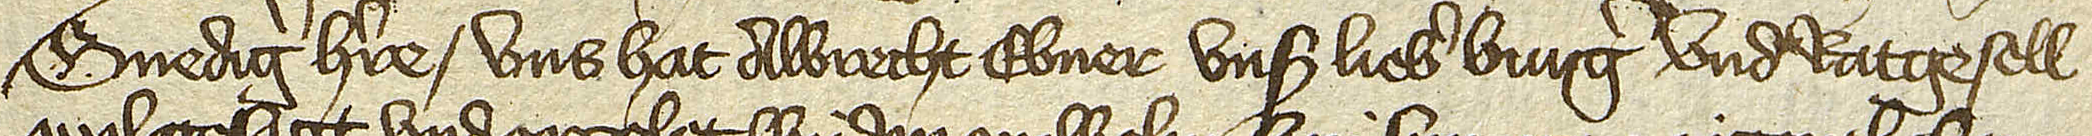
Gnedig* h*re / vns hat Albrecht Ebner vnſ* lieb* burg* vnd Ratgeſell
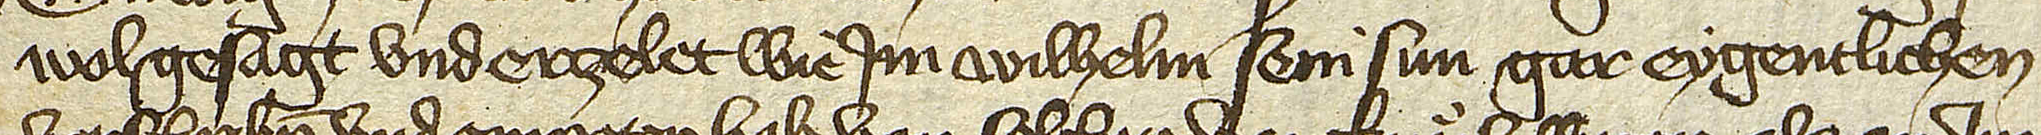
wol geſagt vnd ercʒelet wie Im wilhelm ſein ſun gar eygentlichen
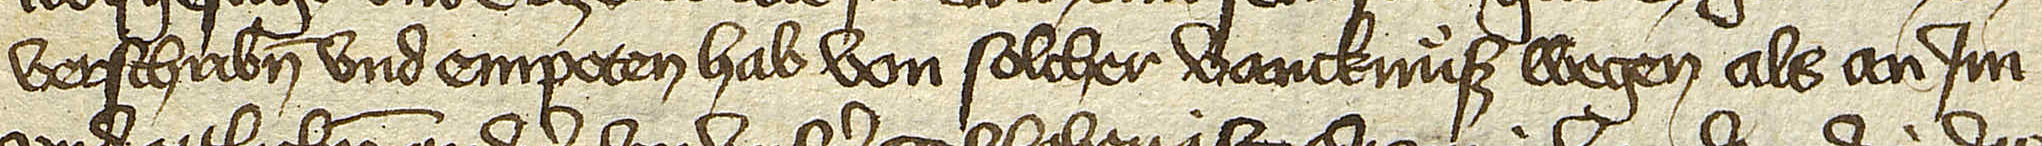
verſchribn* vnd empoten hab von ſolcher vancknüſʒ wegen als an Im
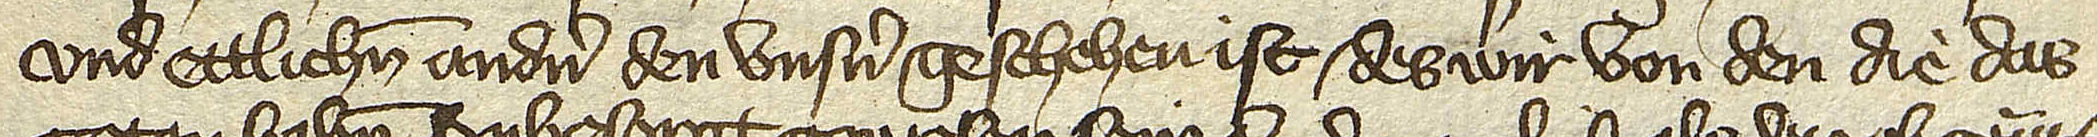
vnd ettlichn* andn* den vnſn* geſchehen iſt / des wir von den die das
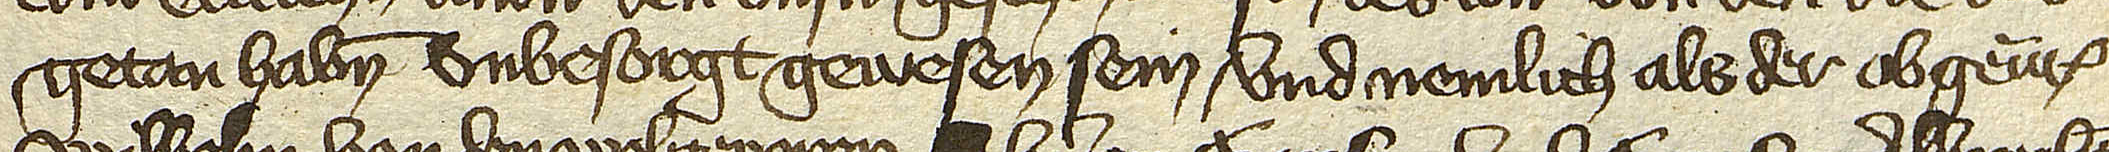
getan habn* vnbeſorgt geweſen ſein / vnd nemlich als der obgent*
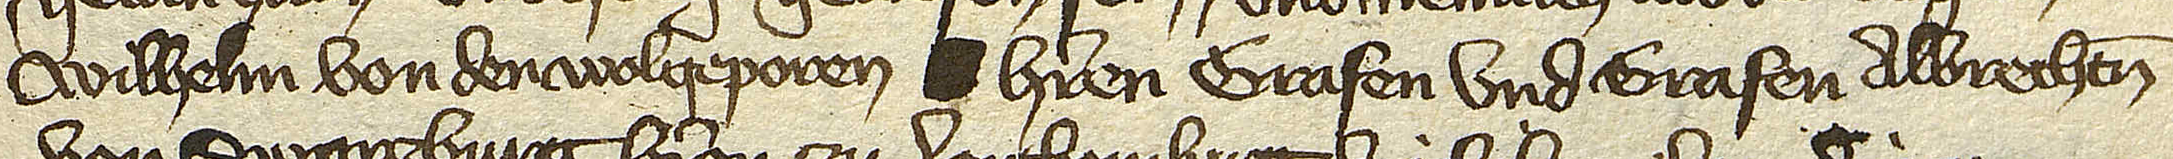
wilhelm von den wolgeporen hr*en Grafen vnd Grafen Albrechtn*
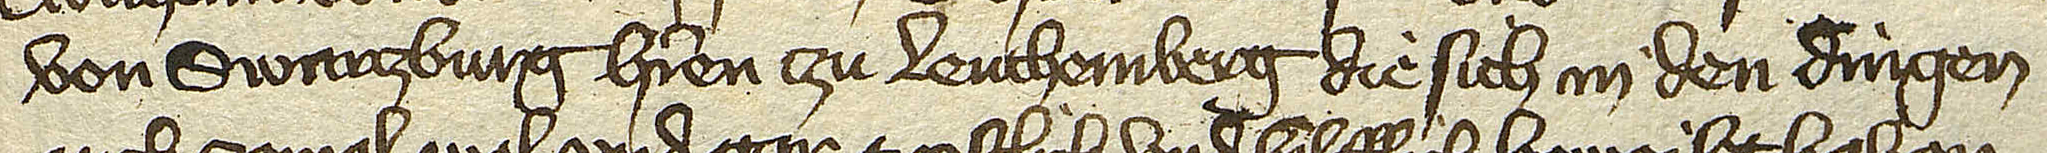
von Swarcʒburg hr*en cʒu Leuthemberg die ſich in den dingen
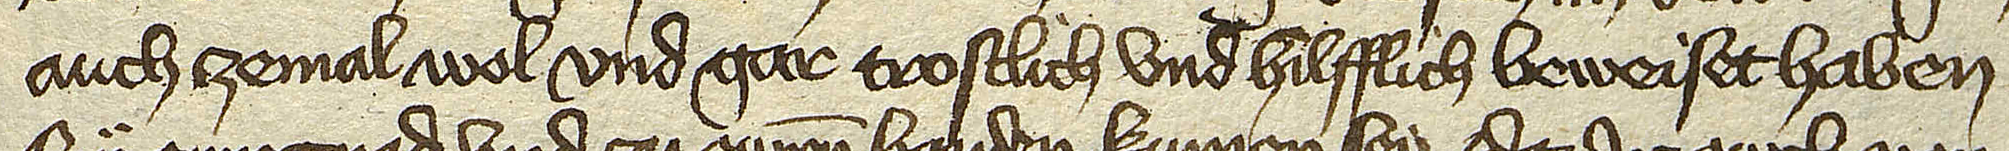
auch cʒemal wol vnd gar troſtlich vnd hilfflich beweiſet haben
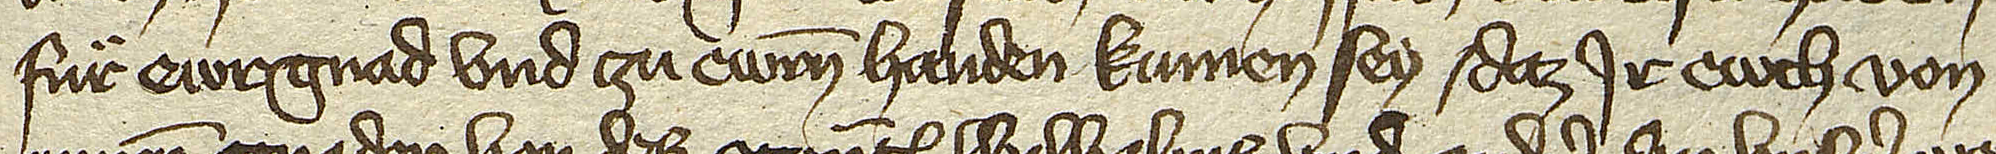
für ewr gnad vnd cʒu ewrn* handen kumen ſey / daʒ Ir ewch von
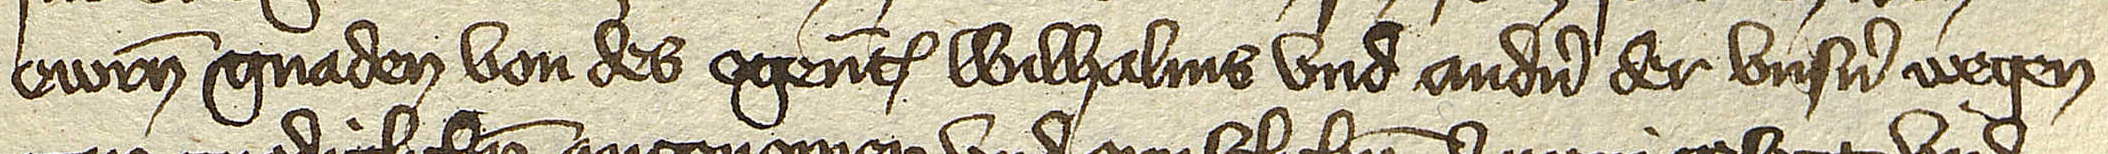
ewrn* gnaden von des egent* wilhalms vnd andn* der vnſn* wegen
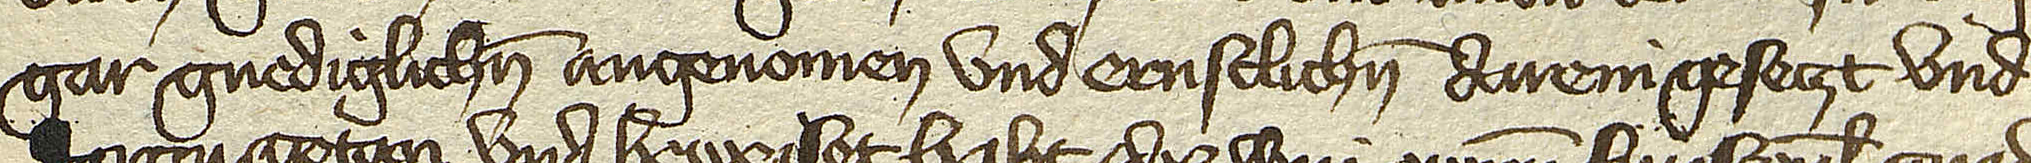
gar gnediglichn* angenomen vnd ernſtlichn* darein geſecʒt vnd
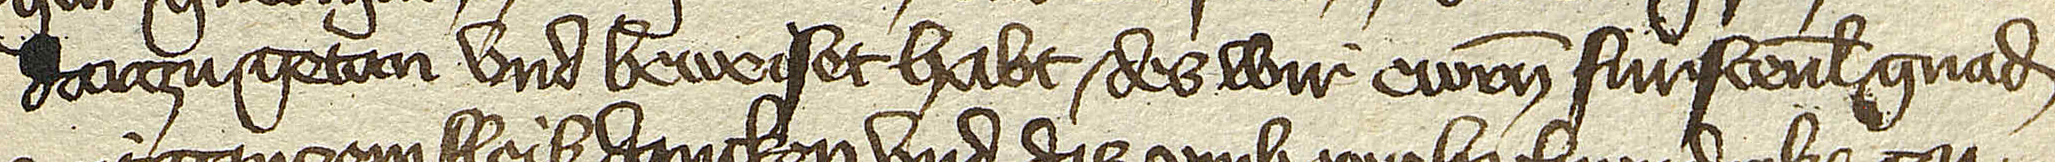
darcʒu getan vnd beweiſet habt / des wir ewrn* fürſtenl* gnad*
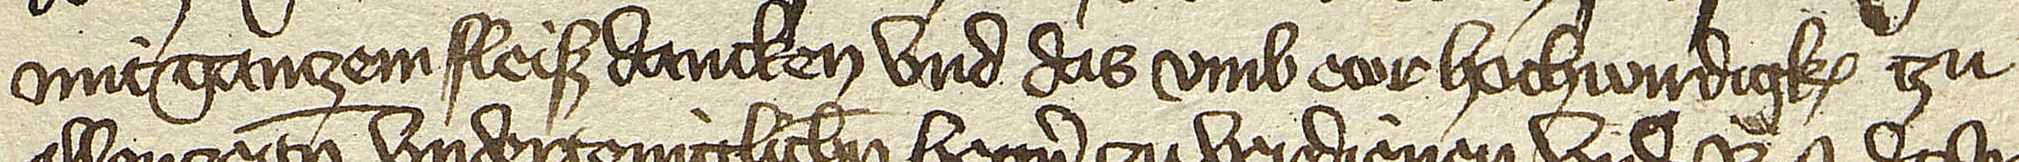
mit gancʒem fleiſʒ dancken vnd das vmb ewr hochwirdigk* cʒu
